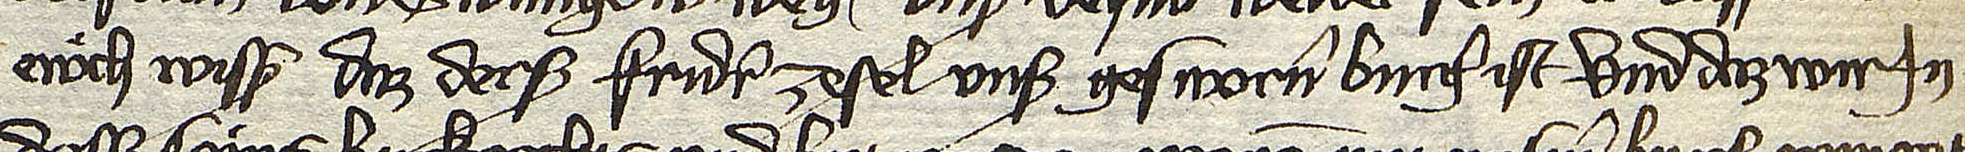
eẅch wiſſ* daʒ derſ* Fridr* ʒeſel vnſ* geſworn* burg* iſt Vnd daʒ wir In
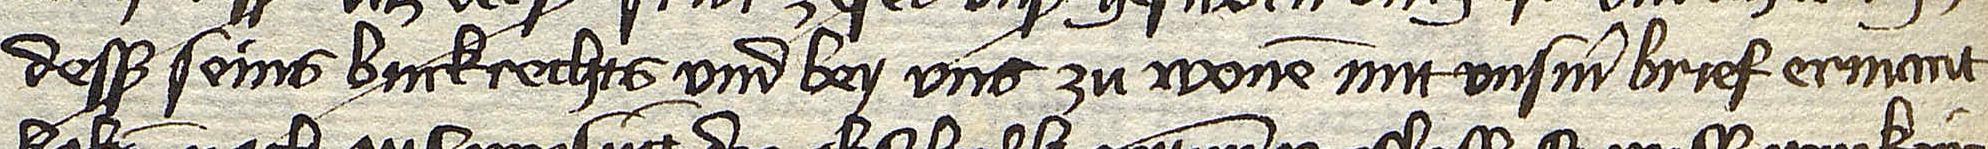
deſſ* ſeins burkrechts vnd bey vns ʒu wone* mit vnſm* brief ermant
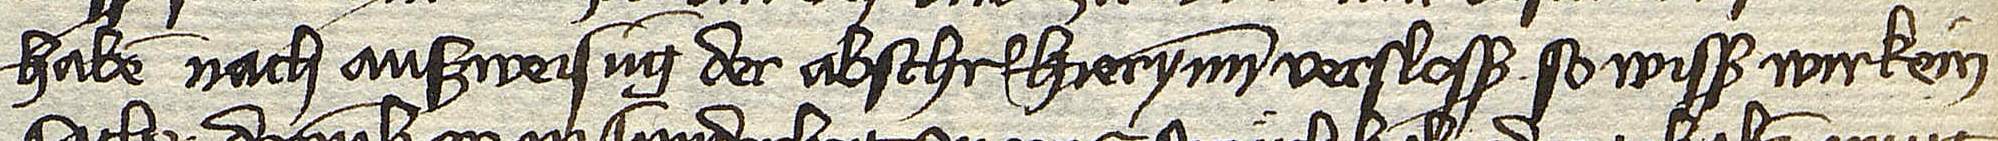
habe* nach auſʒweiſu*g der abſchr* hierynn* verſloſſ* . ſo wiſſ* wir kein
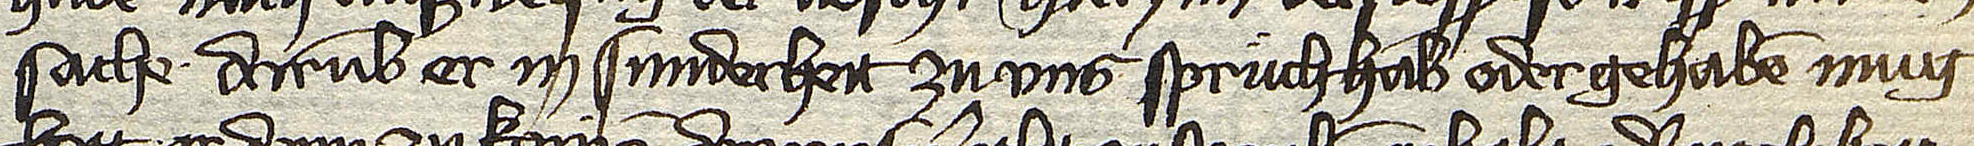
ſache . darub* er in ſunderheit ʒu vns ſprüch hab oder gehabe* mug
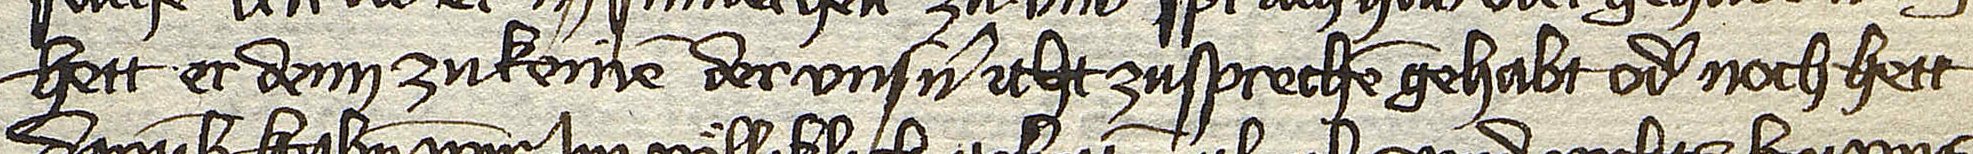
hett er denn ʒu keine* der vnſn* icht ʒuſpreche* gehabt od* noch hett
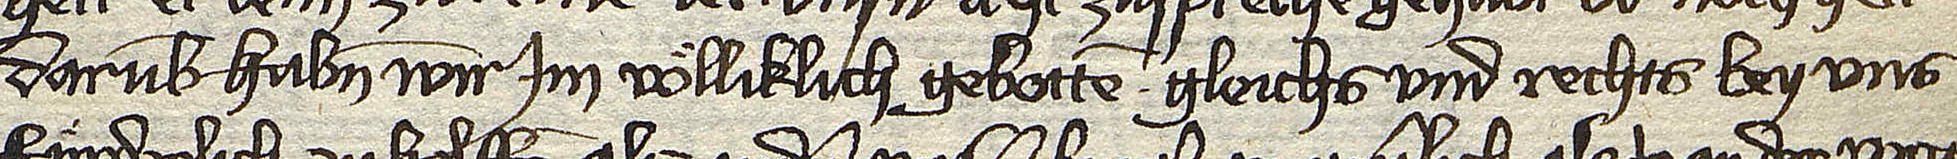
Darub* habn* wir Im völliklich gebotte* . gleichs vnd rechts bey vns
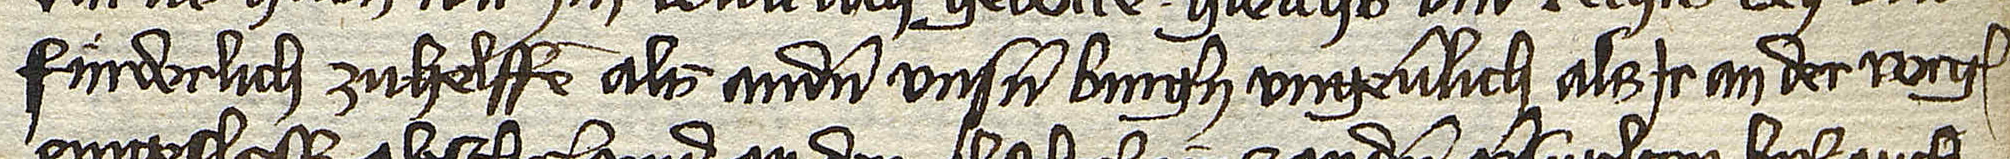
fürderlich ʒuhelffe* als andn* vnſn* burg*n vngeu*lich als Ir an der vorg*
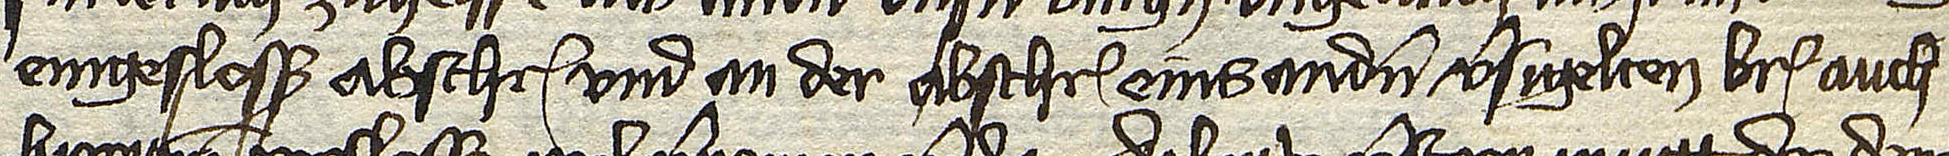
eingeſloſſ* abſchr* vnd an der abſchr* eins andn* v*ſigelten br* auch
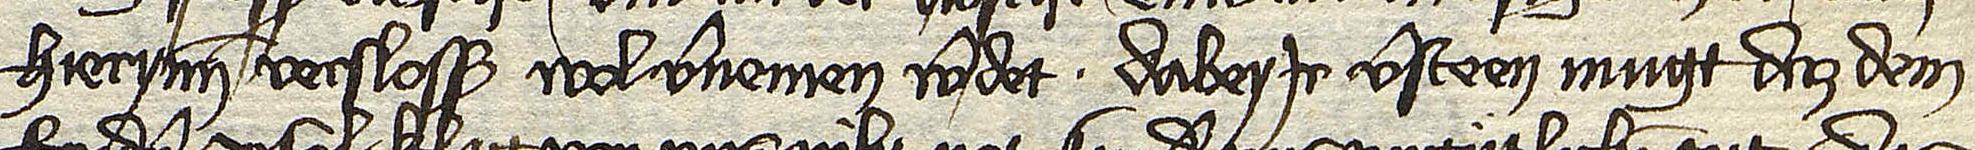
hierynn* verſloſſ* wol v*nemen w*det . Dabey Ir v*ſteen mugt daʒ dem
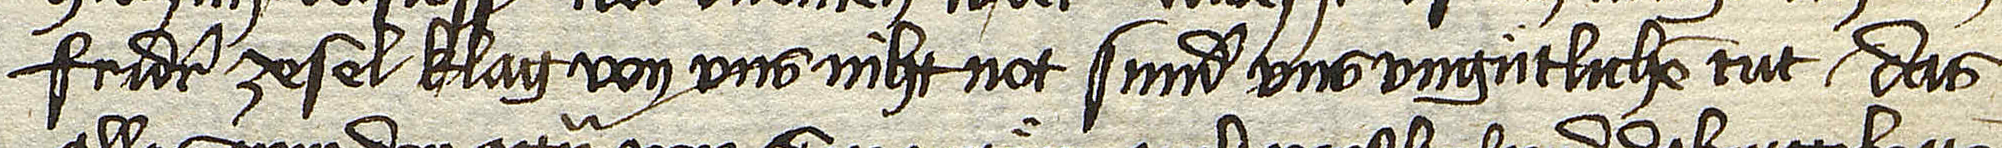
fridr* ʒeſel klag von vns niht not ſund* vns vngütliche* tut / das
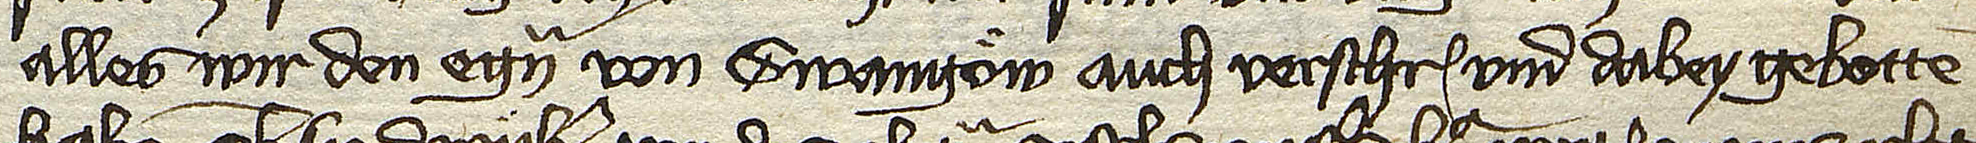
alles wir den egn* von Swangöw auch verſchr* vnd dabey gebotte*
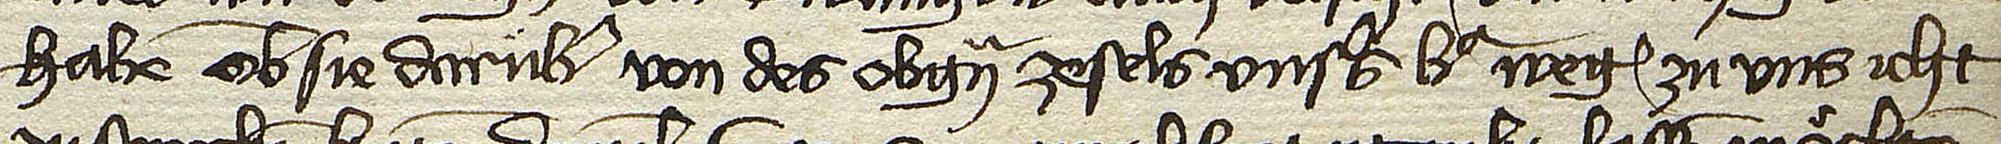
habe* Ob ſie darüb* von des obgn* ʒeſels vnſ*s b* weg* ʒu vns icht
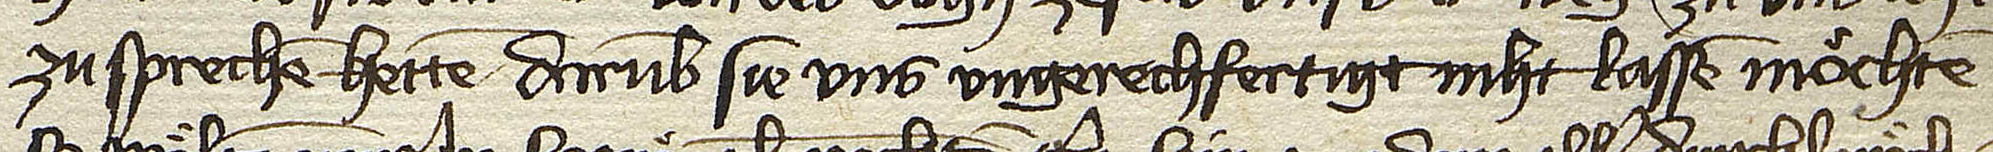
ʒu ſpreche* hette* / darub* ſie vns vngerechfertigt niht laſſe* möchte*
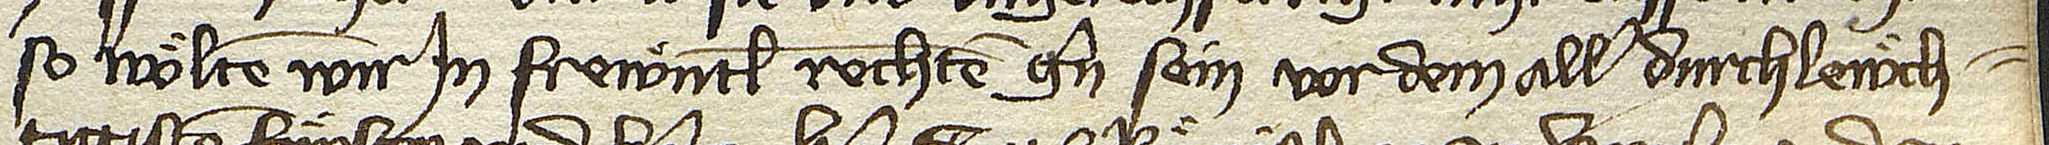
ſo wölte* wir In freẅntl* rechte* g*n ſein vor dem all* durchleẅch =
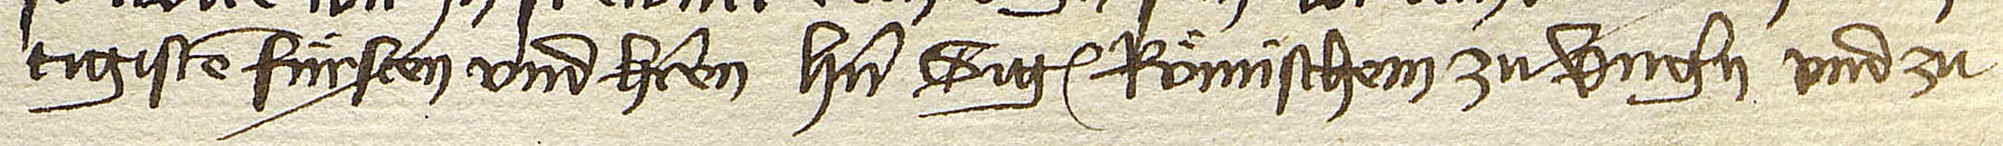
tigiſte* fürſten vnd h*ren hn* Sig* Römiſchem ʒu Vng*n vnd ʒu
